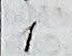1
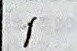1
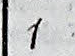1
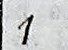1
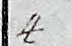4
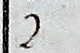2
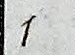1
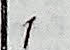1
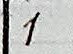1
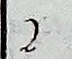2
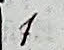1
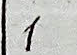1
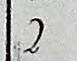2
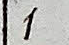1
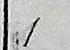1
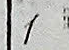1
